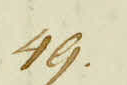49.
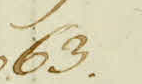63.
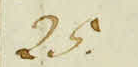25.
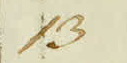13
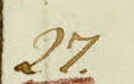27.
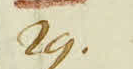19.
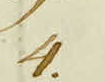4.
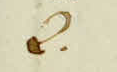2.
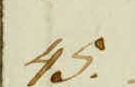45.
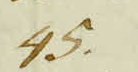45.
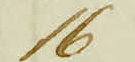16
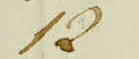12
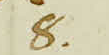8.
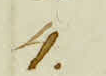4.
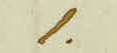1.
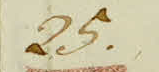25.
